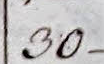30
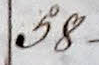58
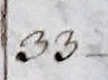33
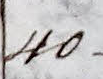40
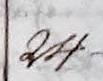24
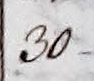30
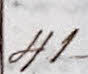41
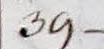39
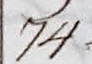74
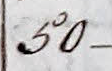50
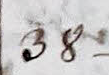38
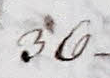36
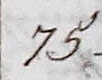75
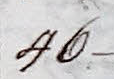46
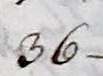36
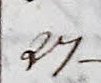27
